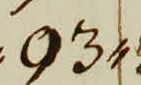93
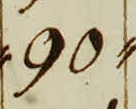90
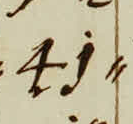41
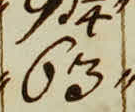63
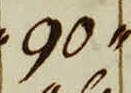90
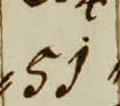51
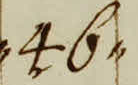46
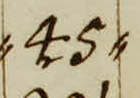45
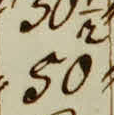50
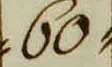60
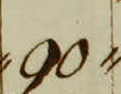90
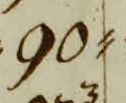90
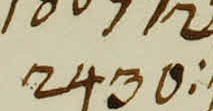2430
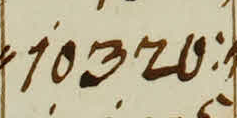10320
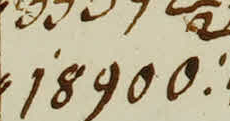18900
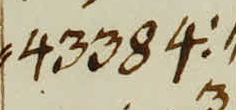43384
